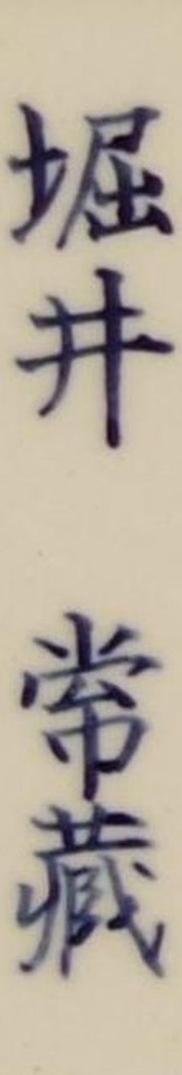堀井常蔵
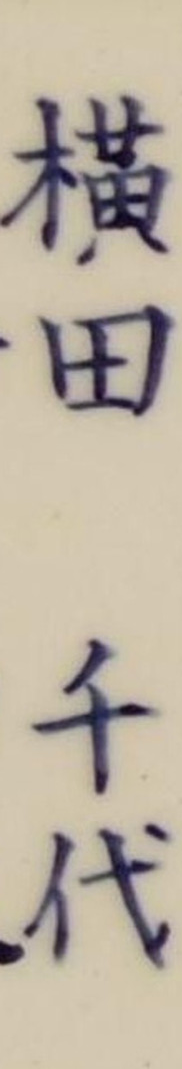横田千代
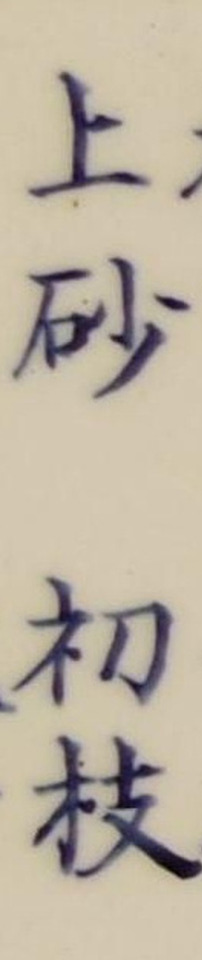上砂初枝
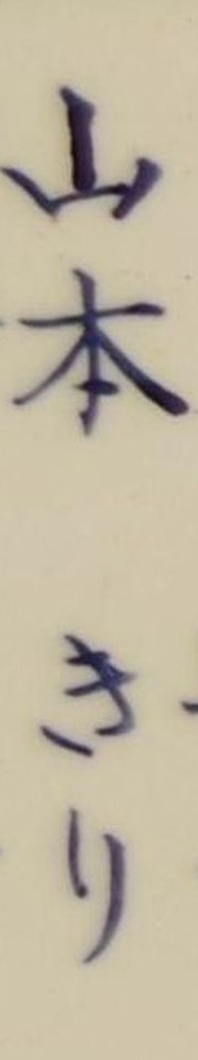山本きり
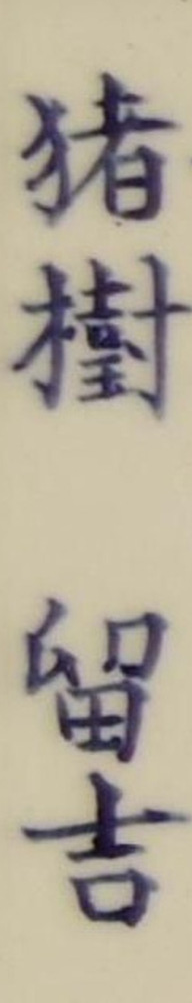猪樹留吉

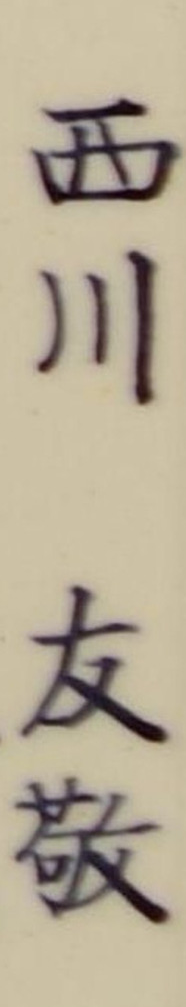西川友敬
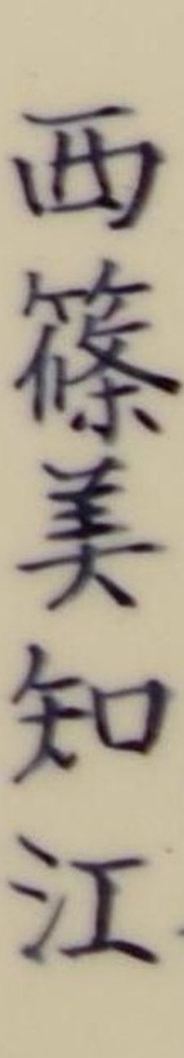西篠美知江
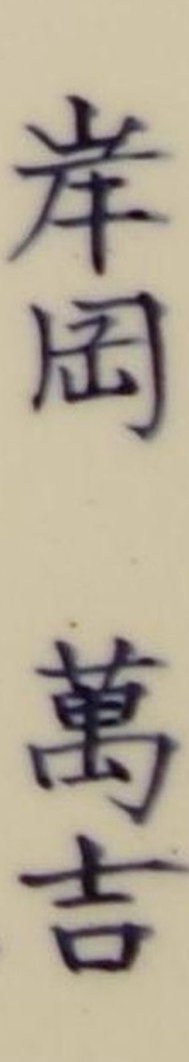岸岡萬吉
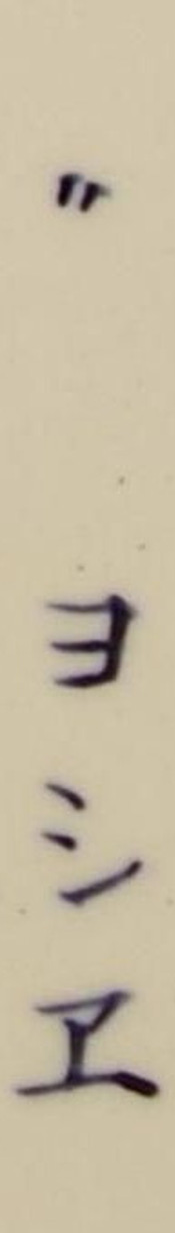ヨシヱ
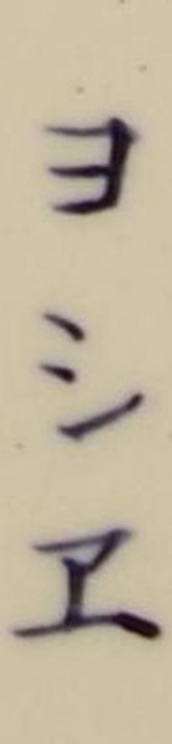ヨシヱ
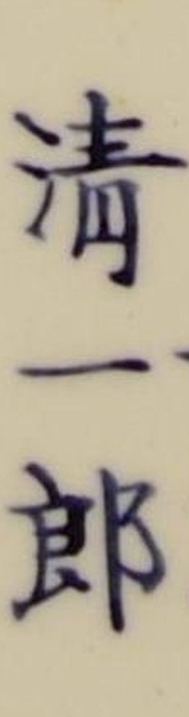清一郎
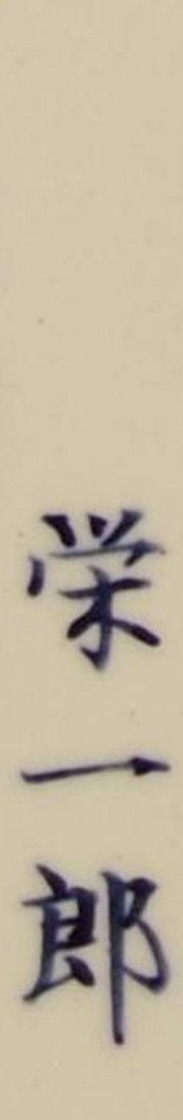栄一郎
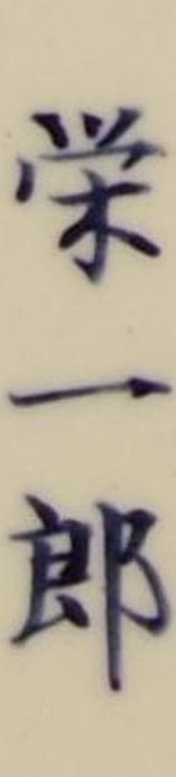栄一郎
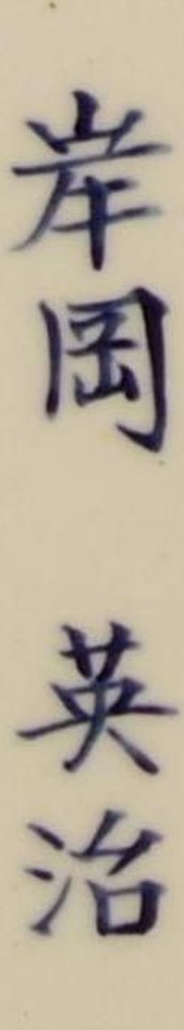岸岡英治
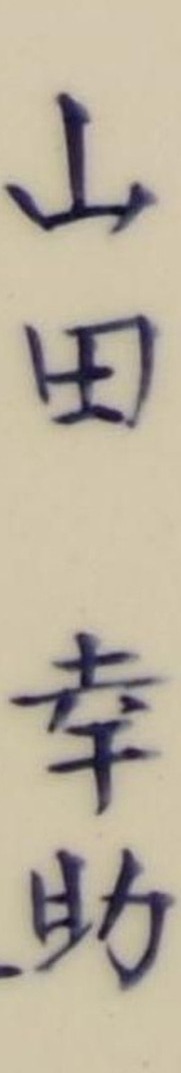山田幸助
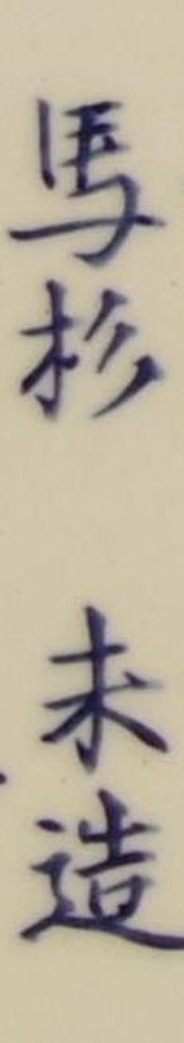馬杉末造
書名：A~D
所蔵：koyasan kongobuji
